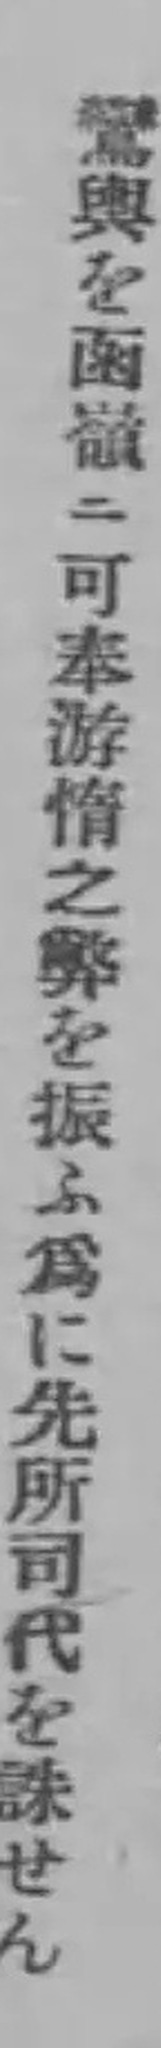鸞輿を函嶺ニ可奉游惰之弊を振ふ為に先所司代を誅せん
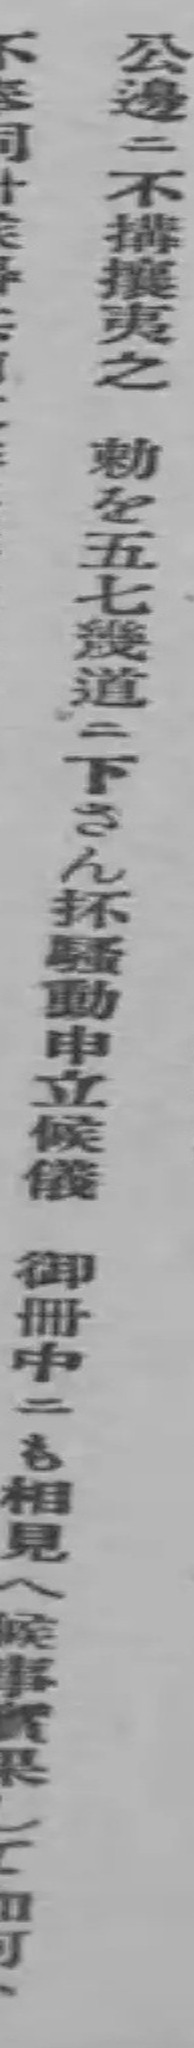公辺ニ不搆攘夷之勅を五七幾道ニ下さん抔騒動申立候儀御冊中ニも相見へ候事実果して如何ハ
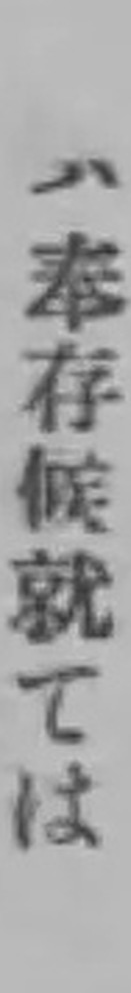ハ奉存候就ては
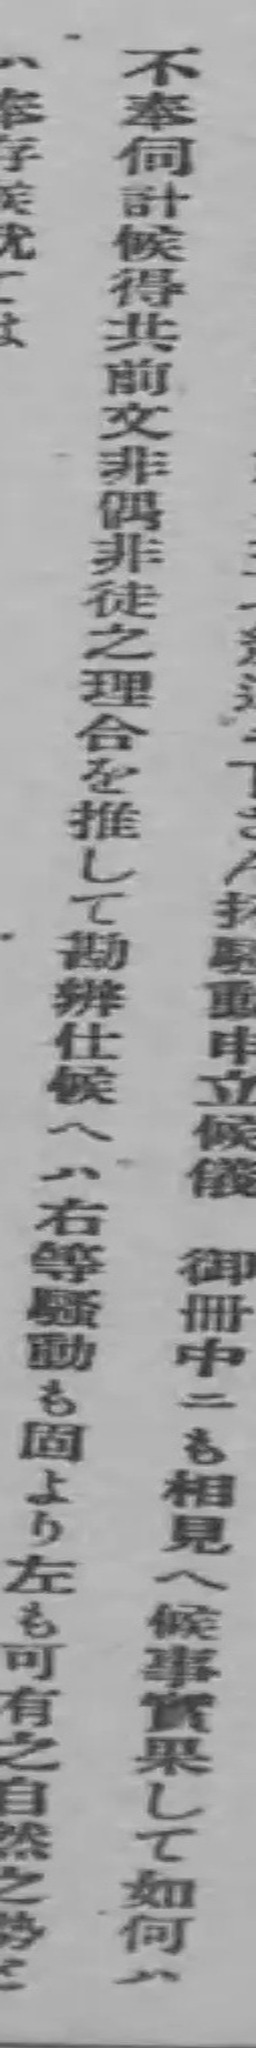不奉伺計候得共前文非偶非徒之理合を推して勘弁仕候へハ右等騒動も固より左も可有之自然之勢と
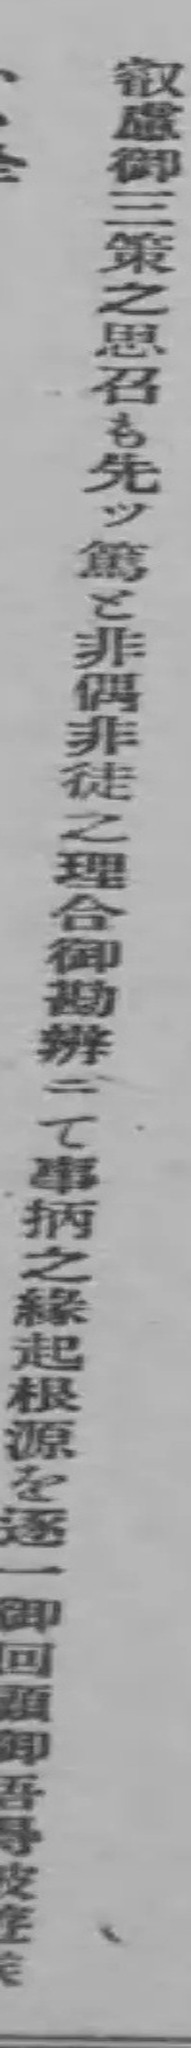叡慮御三策之思召も先ツ篤と非偶非徒之理合御勘弁ニて事柄之縁起根源を逐一御回顧御悟得被遊候
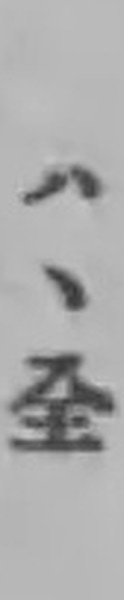ハヽ全
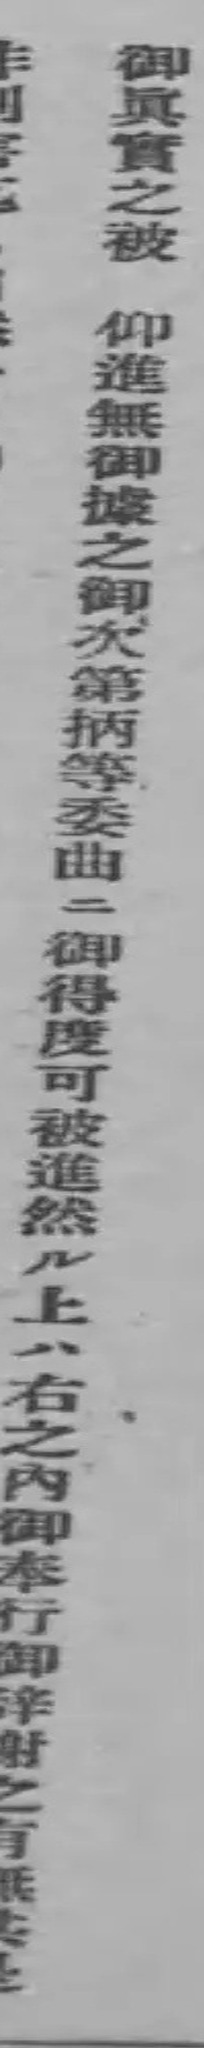御真実之被仰進無御拠之御次第柄等委曲ニ御得度可被進然ル上ハ右之内御奉行御辞謝之有無共是
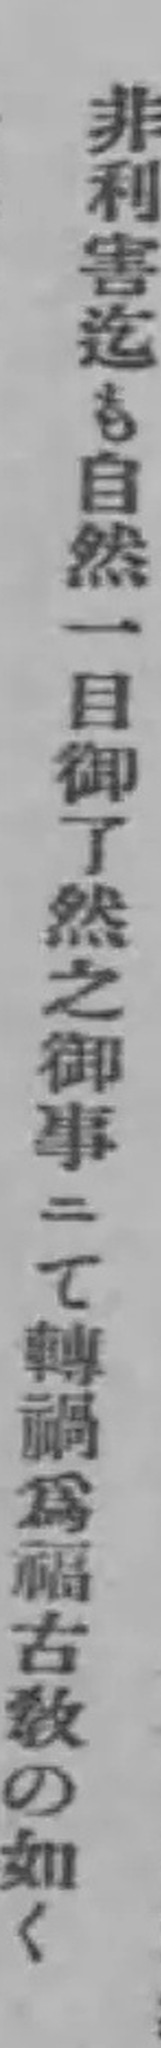非利害迄も自然一目御了然之御事ニて轉禍為福古教の如く
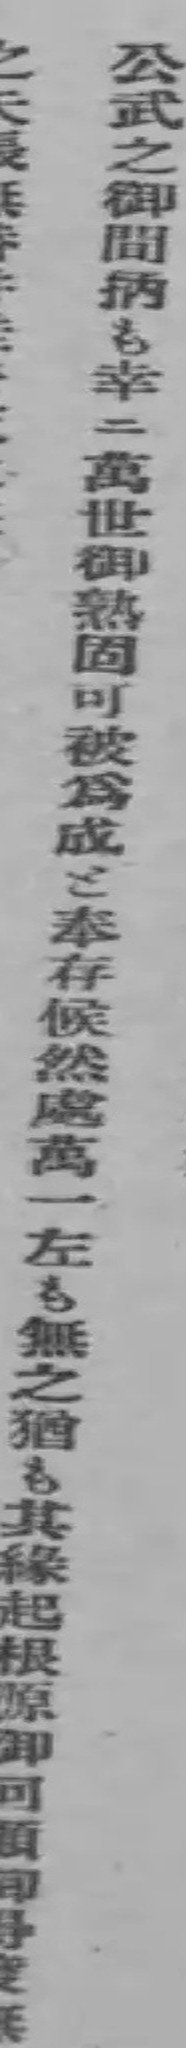公武之御間柄も幸ニ万世御熟固可被為成と奉存候然処万一左も無之猶も其縁起根源御回顧御得度無
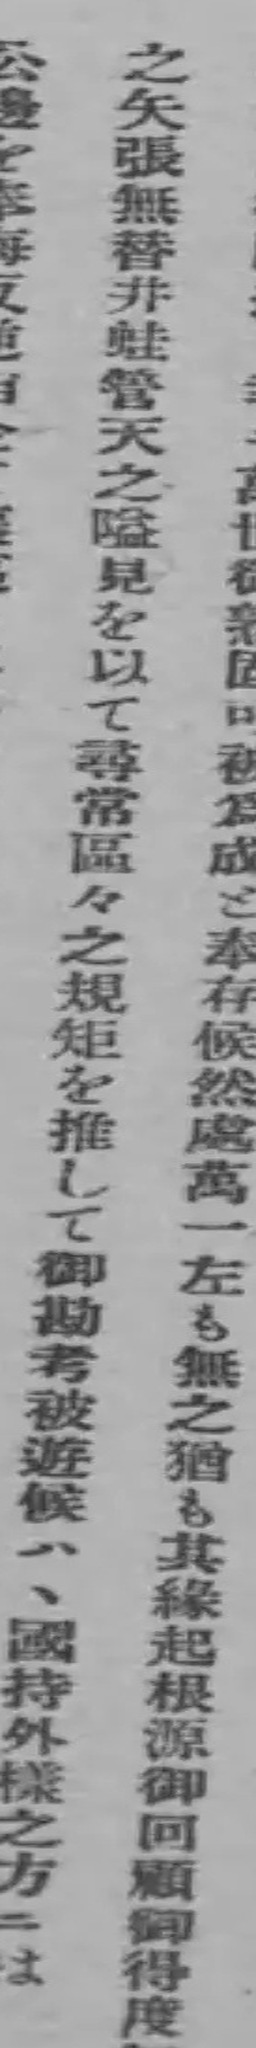之矢張無替井蛙管天之隘見を以て尋常区々之規矩を推して御勘考被遊候ハヽ国持外様之方ニは
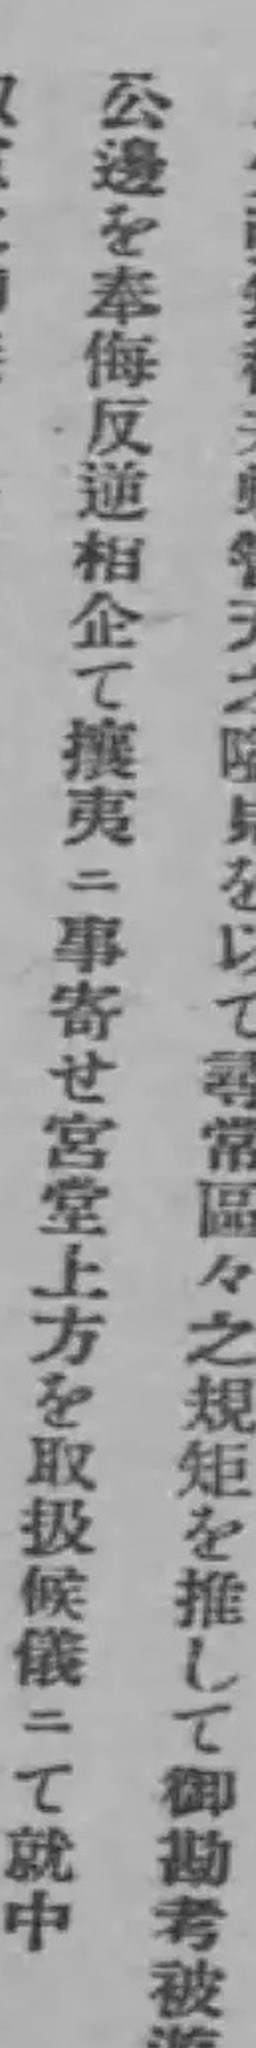公辺を奉侮反逆相企て攘夷ニ事寄せ宮堂上方を取扱候儀ニて就中
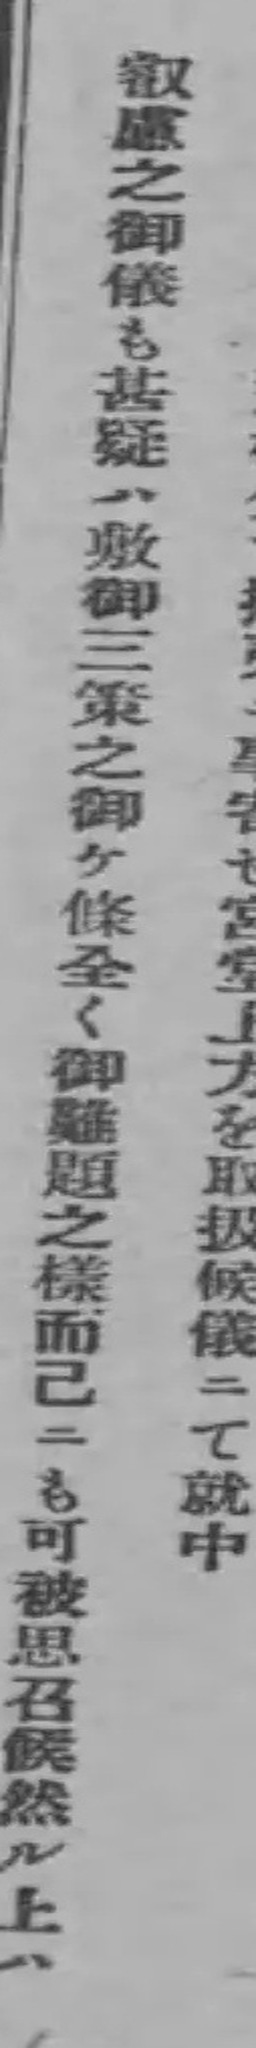叡慮之御儀も甚疑ハ敷御三策之御ケ條全く御難題之様而己ニも可被思召候然ル上ハ
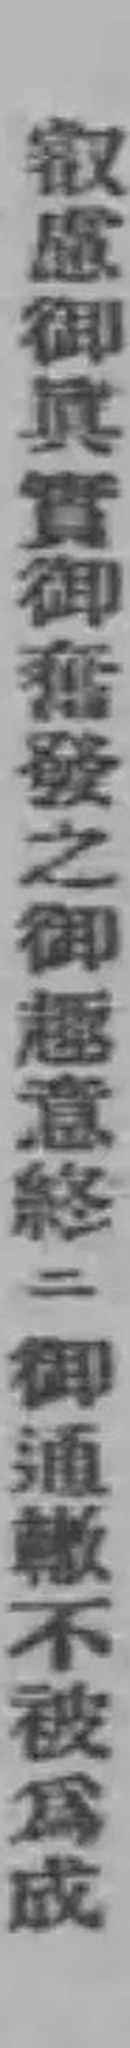叡慮御真実御奮発之御趣意終ニ御通轍不被為成
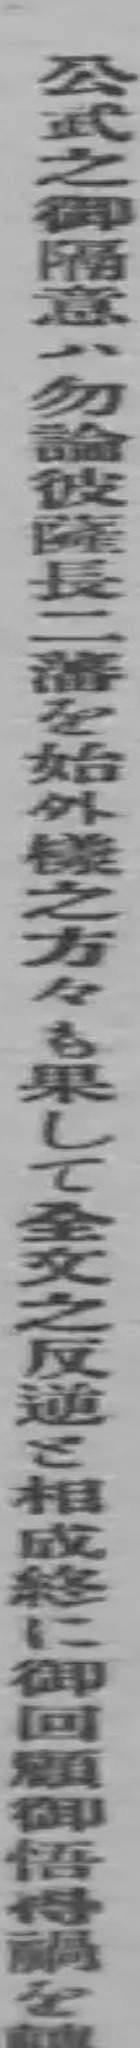公武之御融意ハ勿論彼薩長二藩を始外様之方々も果して全文之反逆と相成終に御回顧御悟得禍を転
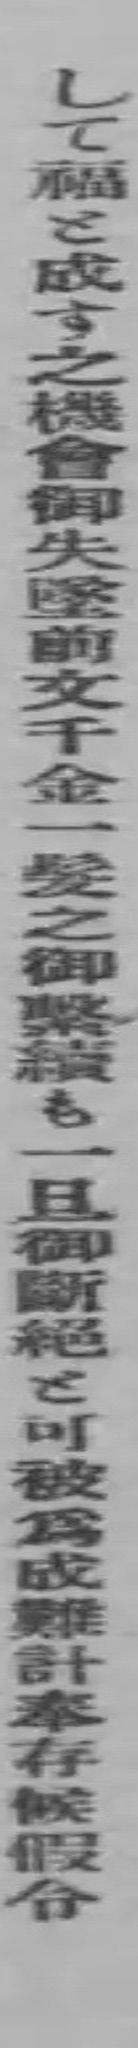して福と成す之機会御失墜前文千金一髪之御繋続も一旦御断絶と可被為成難計奉存候仮令
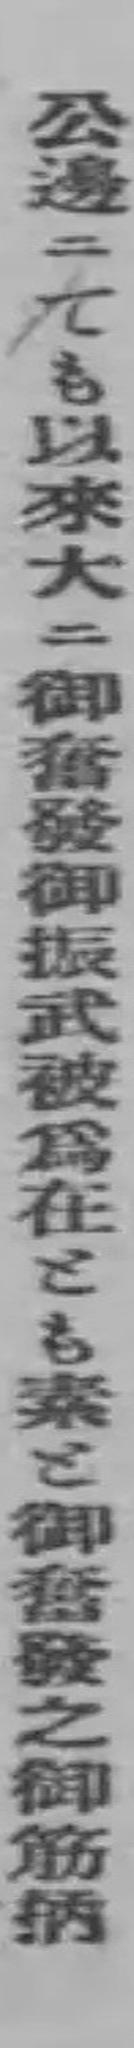公辺ニても以来大ニ御奮発御振武被為在とも素と御奮発之御筋柄
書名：豊橋市史談
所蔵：国立国会図書館 National Diet Library, JAPAN
